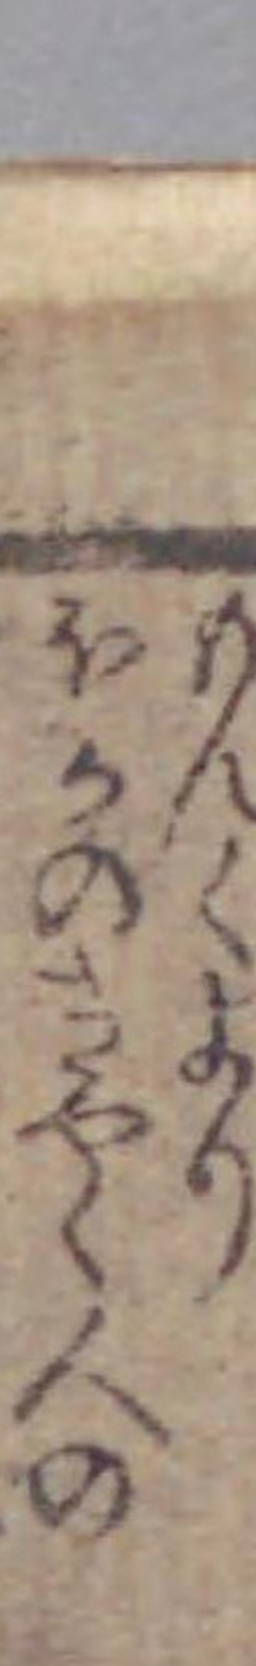ほかのきやく人の
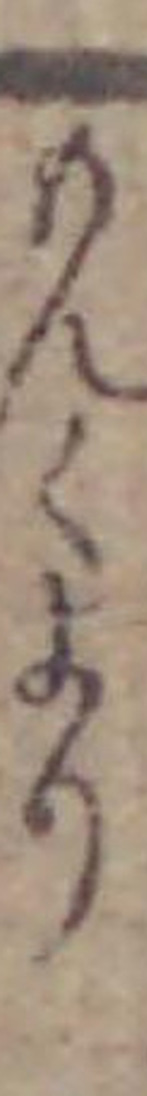もんくより
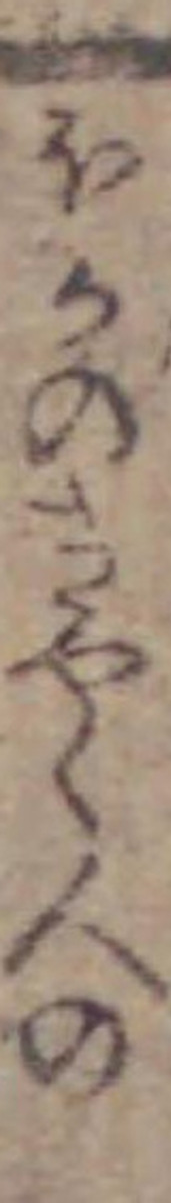ほかのきやく人の
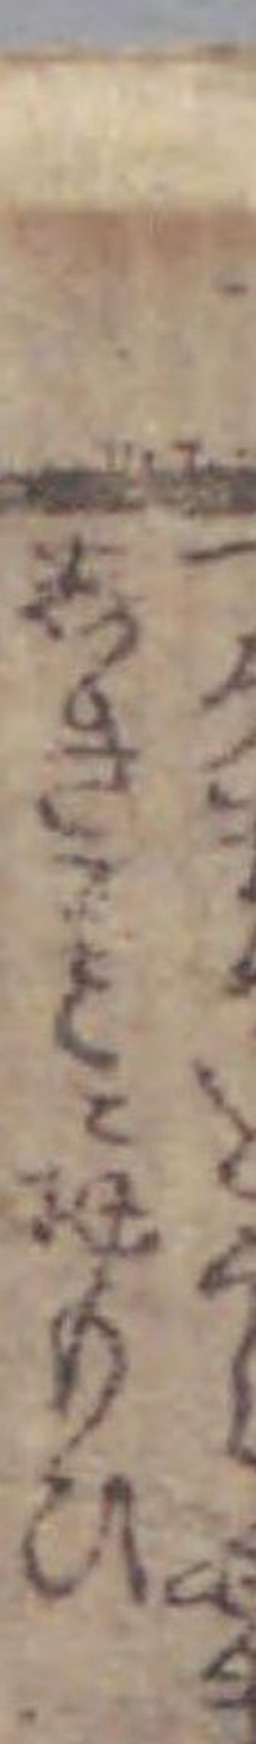しきことにおもひ
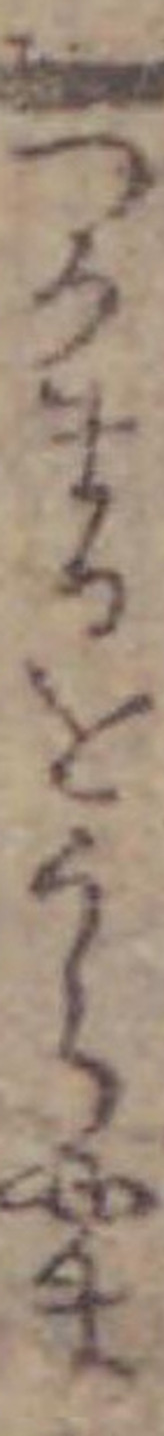つかまるをうらやま
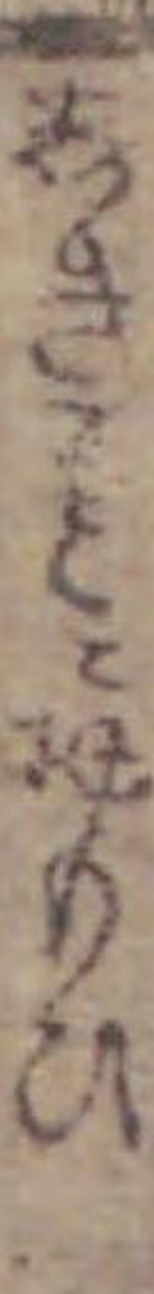しきことにおもひ
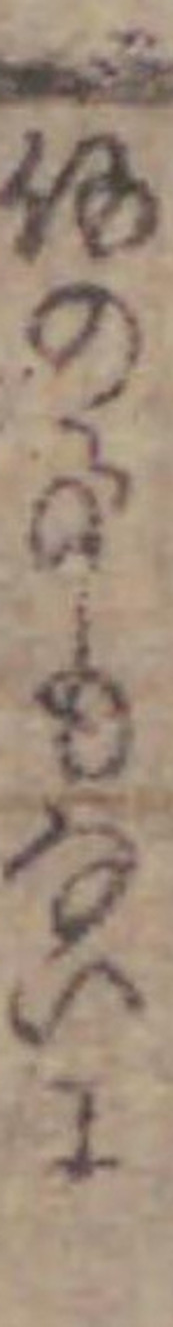何の事もないに
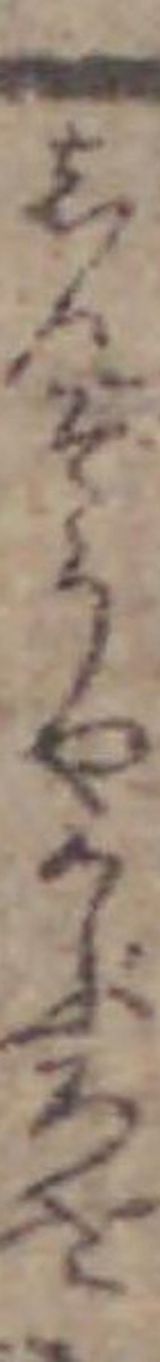しんぞうやかぶろを
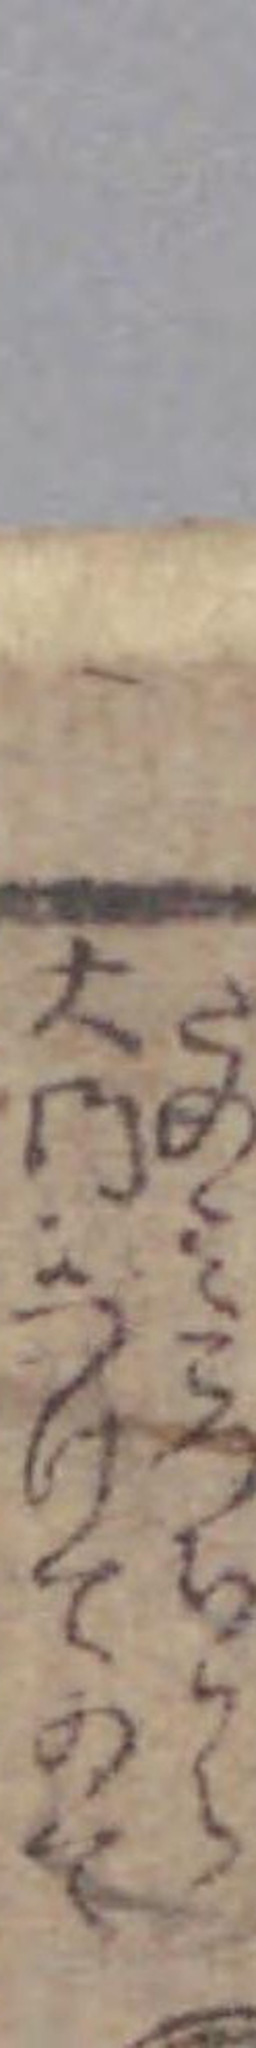大門につけてゐ？て
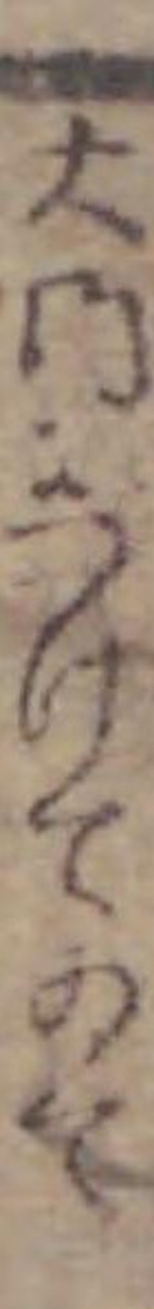大門につけてゐ？て
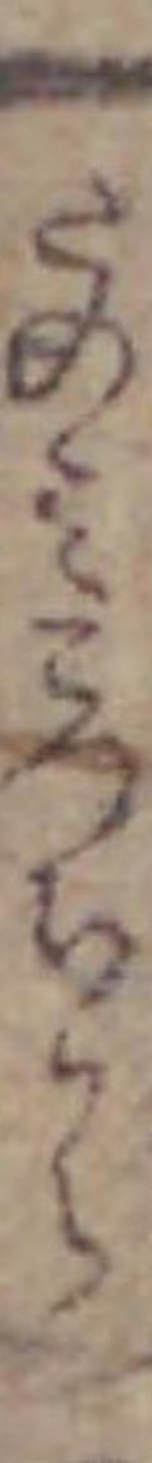たのみこつちから
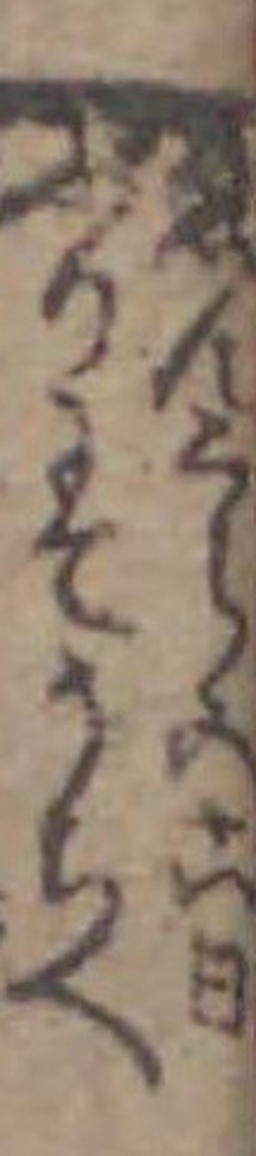ぶりにてうちへ
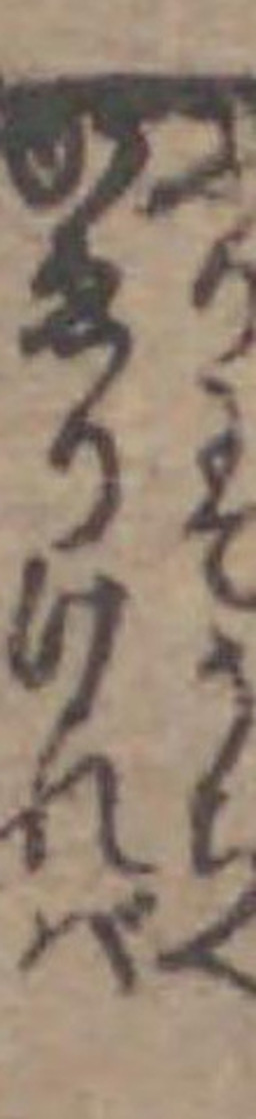かゑりければ
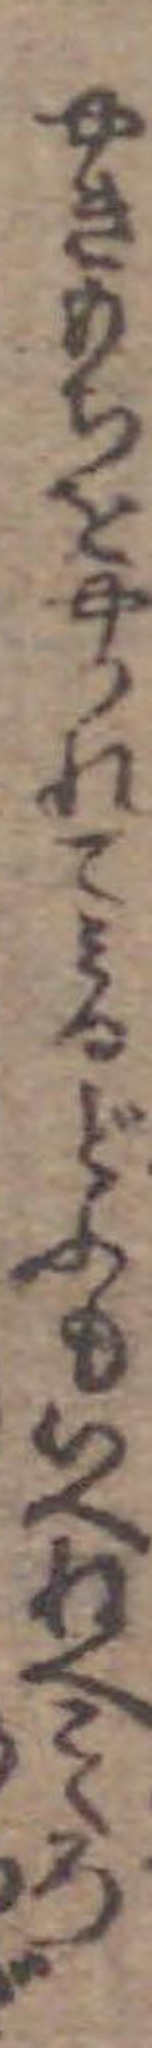やきもちをやかれてみるどふもいへねへこゝろもちだ
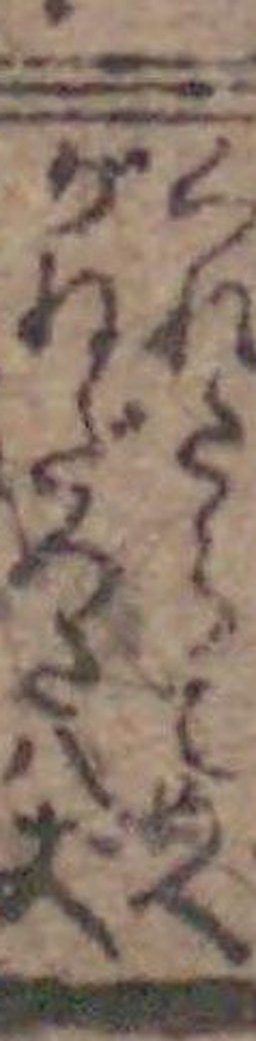がねだつた八丈
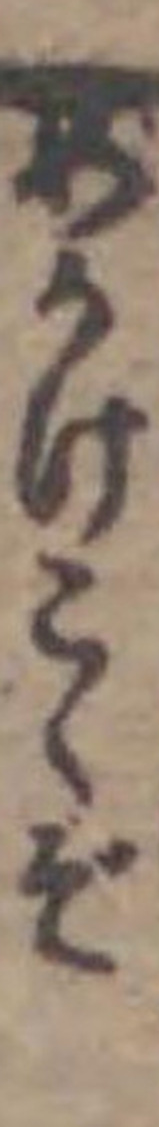めかけこゝぞ
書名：江戸生艶気樺焼 : 3巻
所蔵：国立国会図書館 National Diet Library, JAPAN
